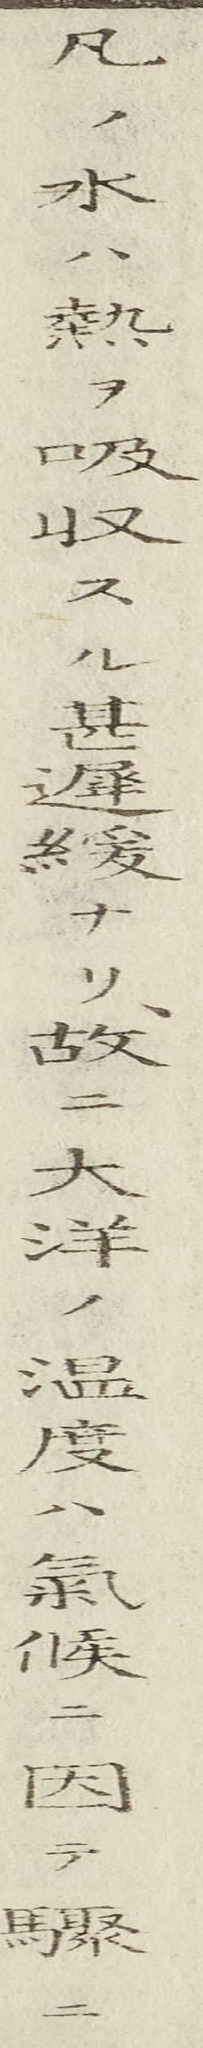凡ノ水ハ熱ヲ吸収スル甚遅緩ナリ、故ニ大洋ノ温度ハ気候ニ因テ驟ニ
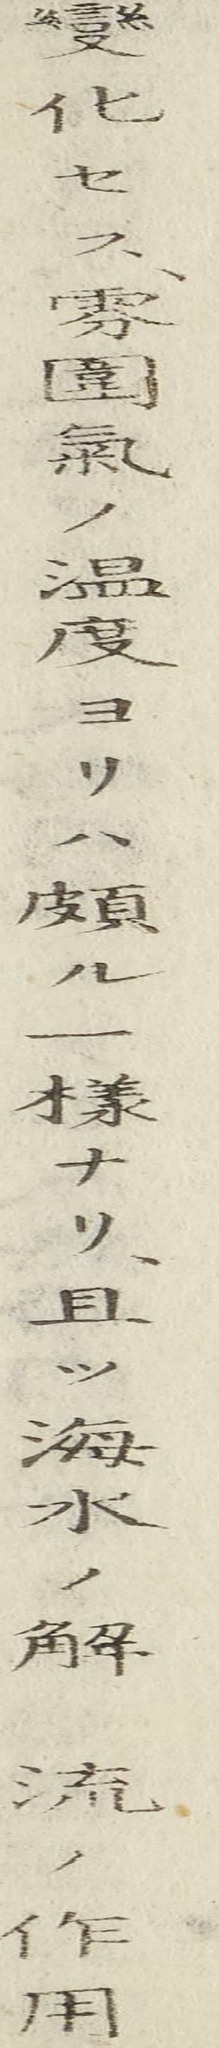変化セス、雰囲気ノ温度ヨリハ頗ル一様ナリ、且ツ海水ノ解流ノ作用

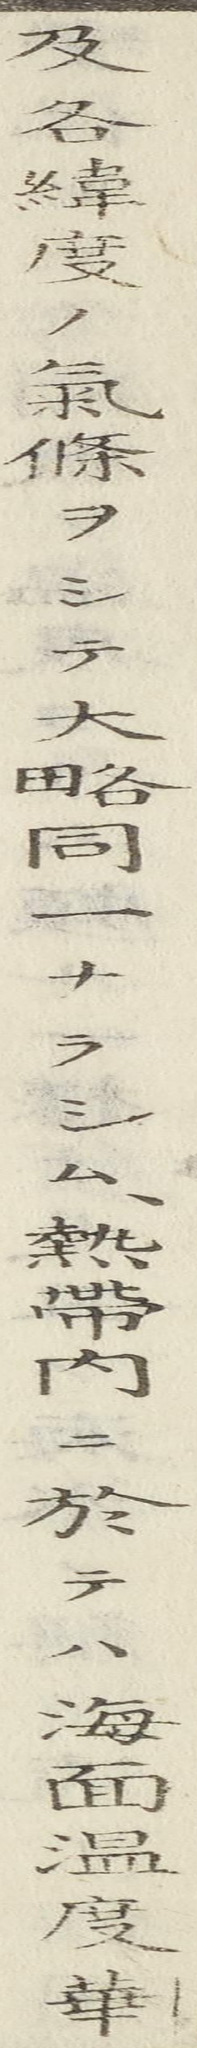及各緯度ノ気条ヲシテ大略同一ナラシム、熱帯内ニ於テハ海面温度華
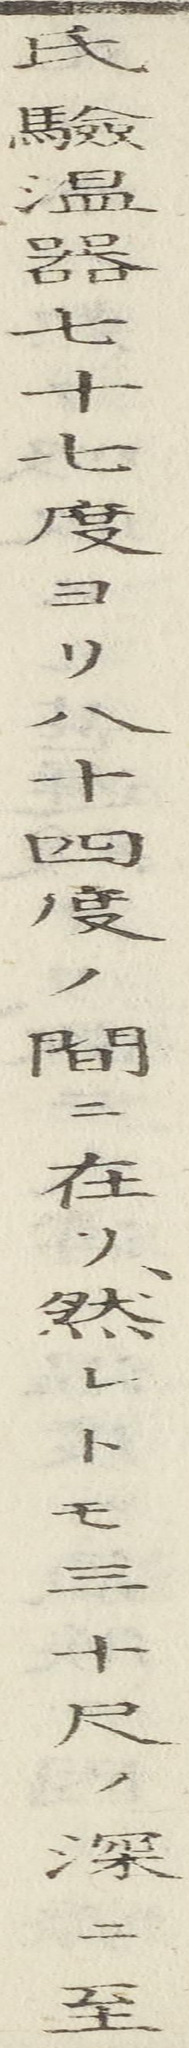氏験温器七十七度ヨリ八十四度ノ間ニ在リ、然レトモ三十尺ノ深ニ至
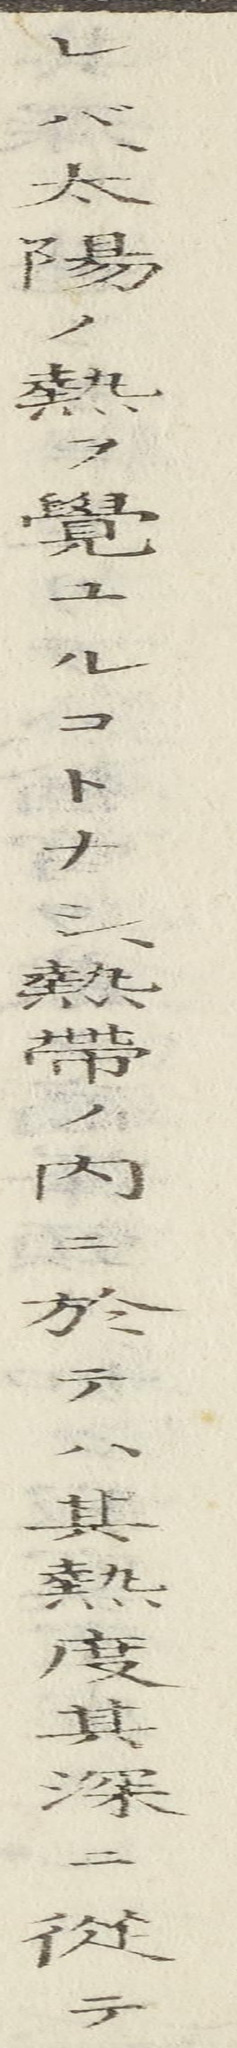レバ、太陽ノ熱ヲ覚ユルコトナシ、熱帯ノ内ニ於テハ其熱度其深ニ従テ
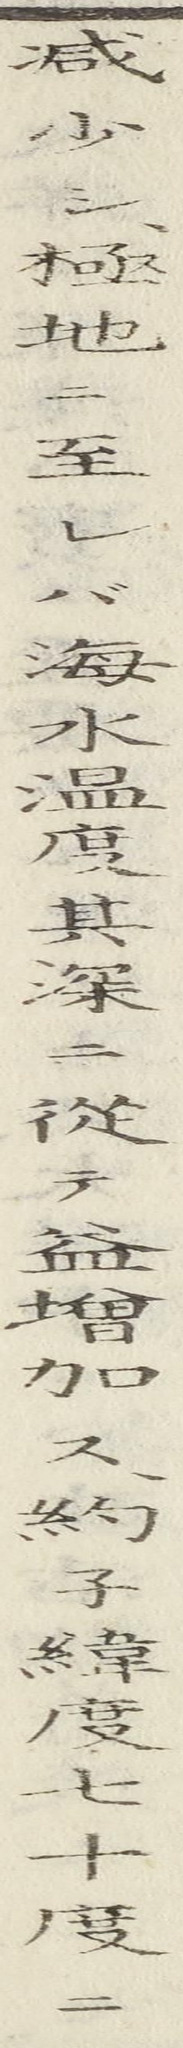減少シ、極地ニ至レバ海水温度其深ニ従テ益増加ス、約ネ緯度七十度ニ
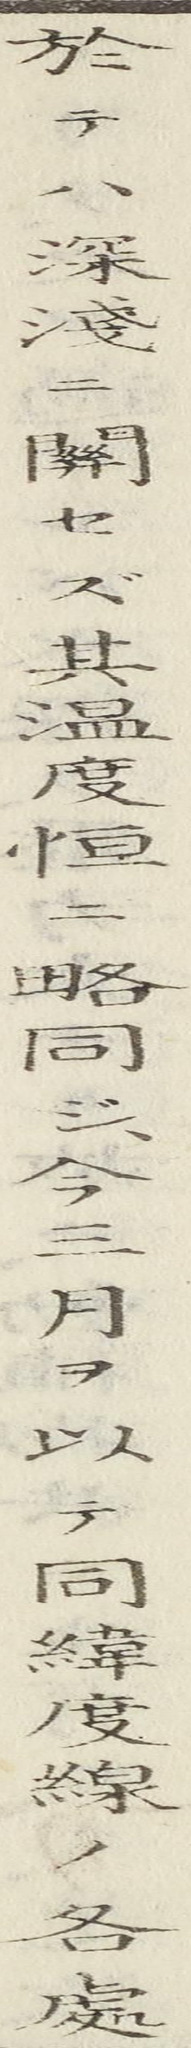於テハ深浅ニ関セズ其温度恒ニ略同ジ、今三月ヲ以テ同緯度線ノ各処
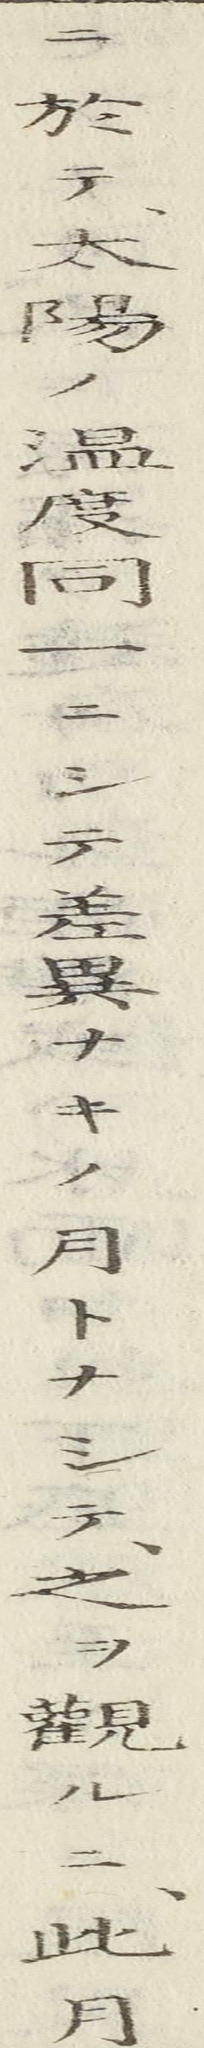ニ於テ、太陽ノ温度同一ニシテ差異ナキノ月トナシテ、之ヲ観ルニ、此月
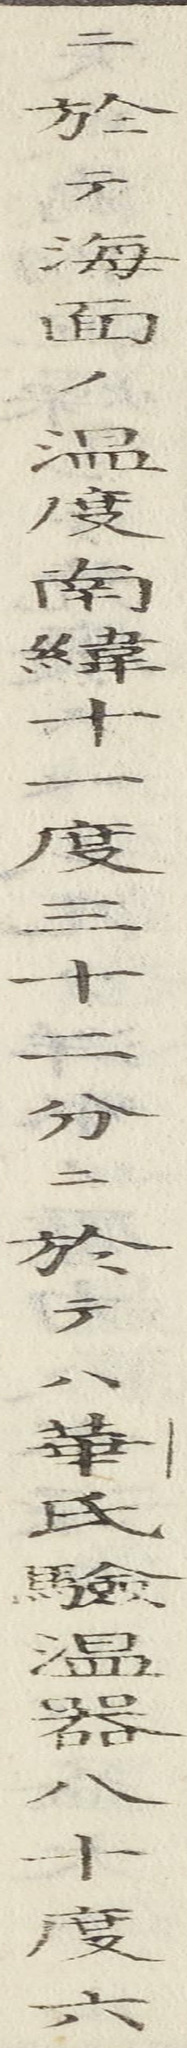ニ於テ海面ノ温度南緯十一度三十二分ニ於テハ華氏験温器八十度六
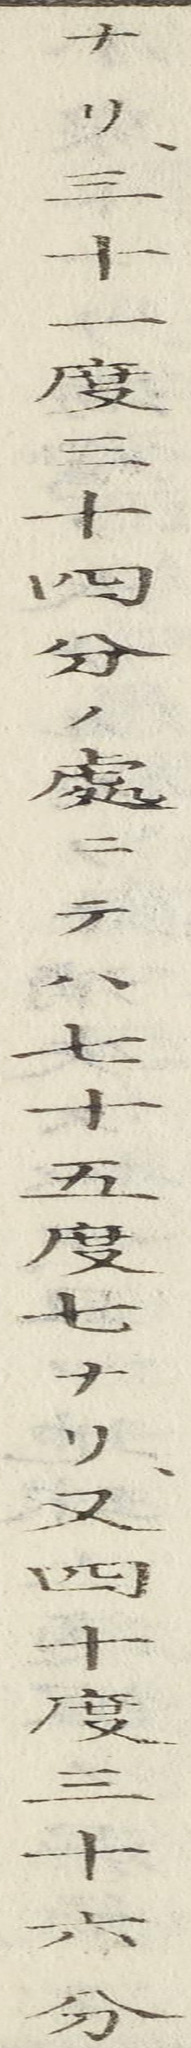ナリ、三十一度三十四分ノ処ニテハ七十五度七ナリ、又四十度三十六分
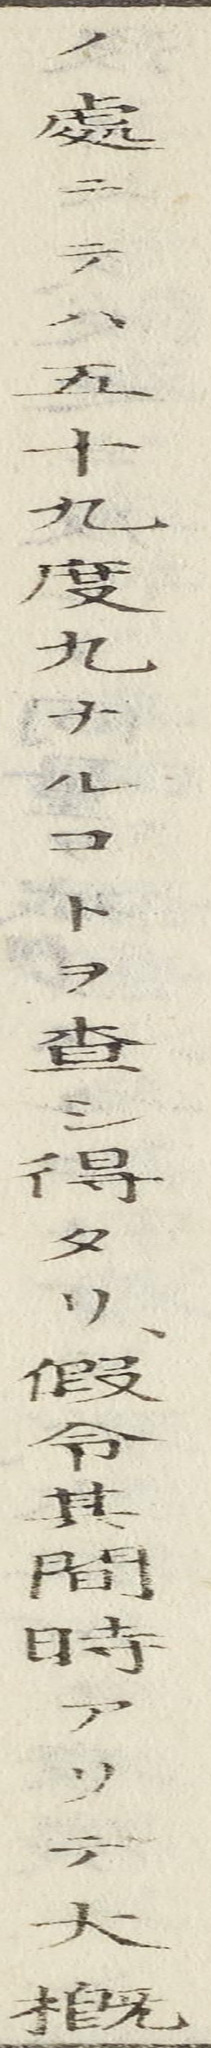ノ処ニテハ五十九度九ナルコトヲ査シ得タリ、仮令其間時アリテ大概
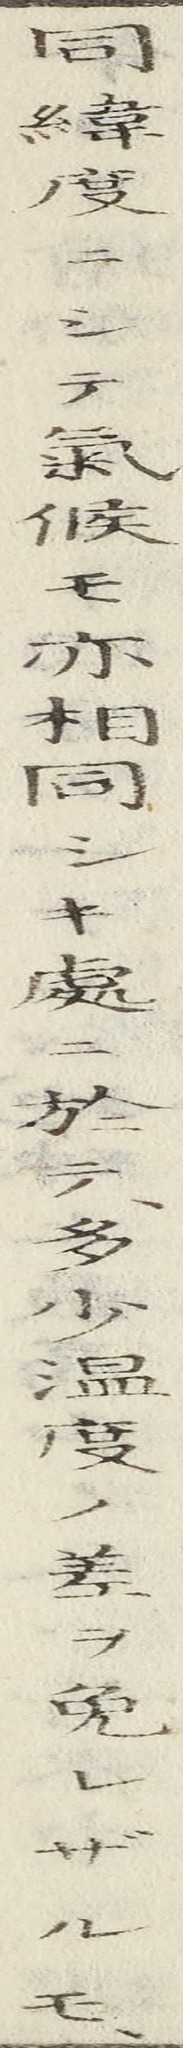同緯度ニシテ気候モ亦相同シキ処ニ於テ、多少温度ノ差ヲ免レザルモ、
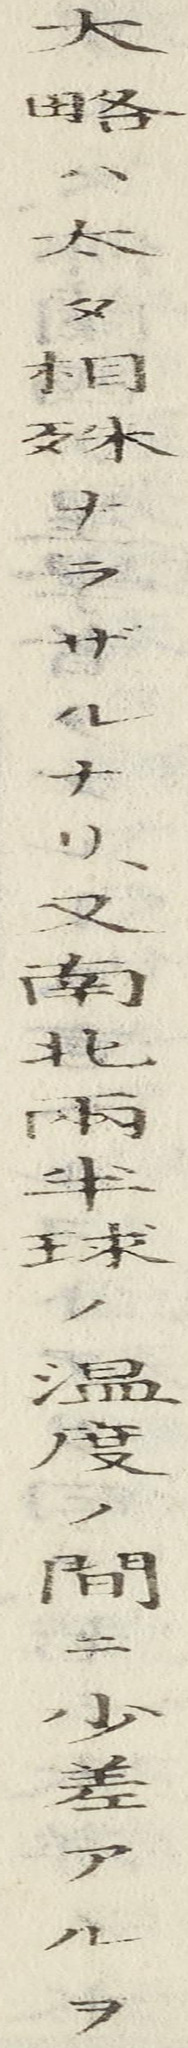大略ハ太タ相殊ナラザルナリ、又南北両半球ノ温度ノ間ニ少差アルヲ
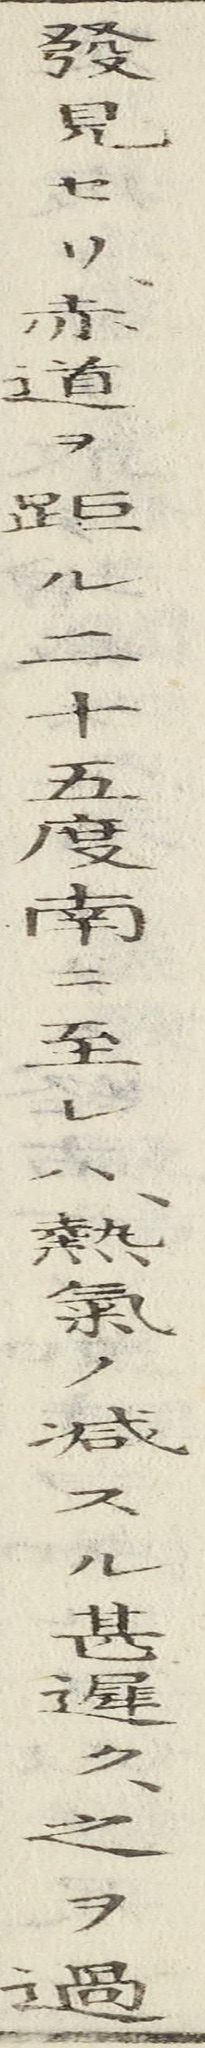発見セリ、赤道ヲ距ル二十五度南ニ至レハ、熱気ノ減スル甚遅ク、之ヲ過
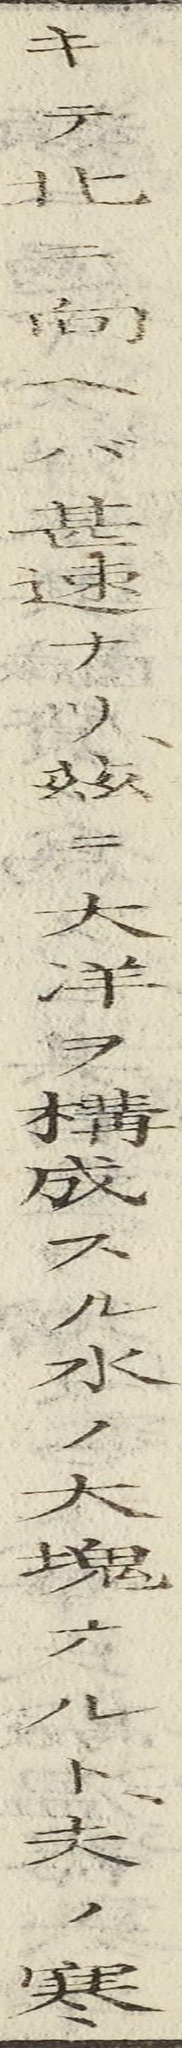キテ北ニ向ヘバ甚速ナリ、茲ニ大洋ヲ構成スル水ノ大塊ナルト、夫ノ寒
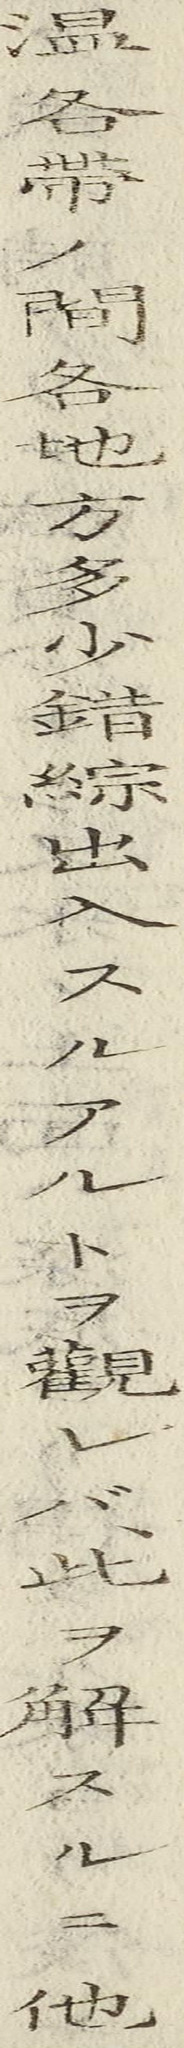温各帯ノ間各地方多少錯綜出入スルアルトヲ観レバ、此ヲ解スルニ他
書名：百科全書　地文學　全
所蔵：東京大学地震研究所図書室 Earthquake Research Institute Library, The University of Tokyo, JAPAN
